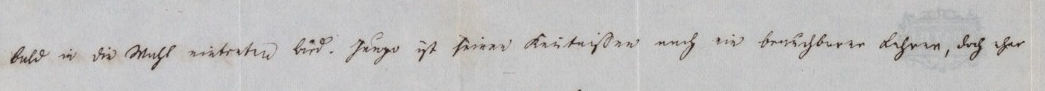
bald in die Wahl eintreten wird. Jeugo ist seinen Kenntnißen nach ein brauchbarer Lehrer, doch eher
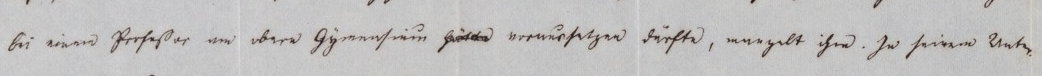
bei einem Professor am obern Gymnasium hätte voraussetzen dürfte, mangelt ihm. In seinem Unter-
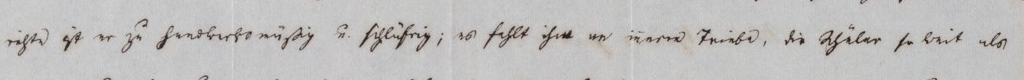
richte ist er zu handwerksmäßig u. schläfrig; es fehlt ihm an innerm Triebe, die Schüler so weit als
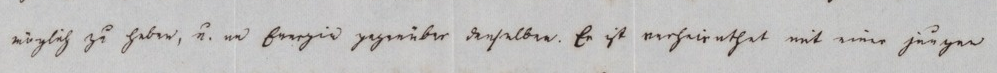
möglich zu heben, u. an Energie gegenüber denselben. Er ist verheirathet mit einer jungen
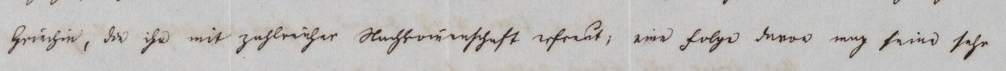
Griechin, die ihn mit zahlreicher Nachkommenschaft erfreut; eine Folge davon mag seine sehr
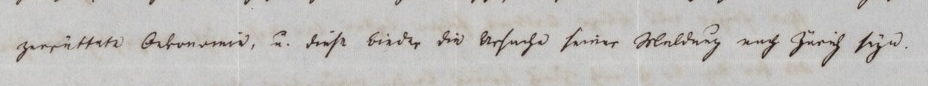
zerrüttete Oekonomie, u. diese wieder die Ursache seiner Meldung nach Zürich seyn.
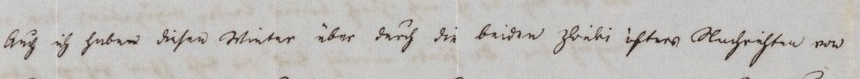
Auch ich habe diesen Winter über durch die beiden Zwicki öfters Nachrichten von
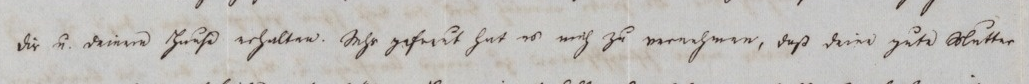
dir u. deinem Hause erhalten. Sehr gefreut hat es mich zu vernehmen, daß deine gute Mutter
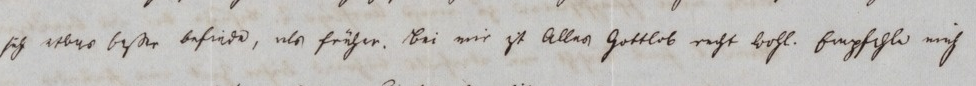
sich etwas besser befindet als früher. Bei mir ist Alles Gottlob recht wohl. Empfehle mich
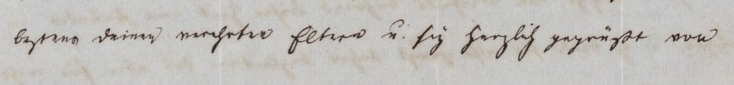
bestens deinen verehrten Eltern u. sey herzlich gegrüßt von
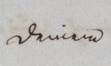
deinem
